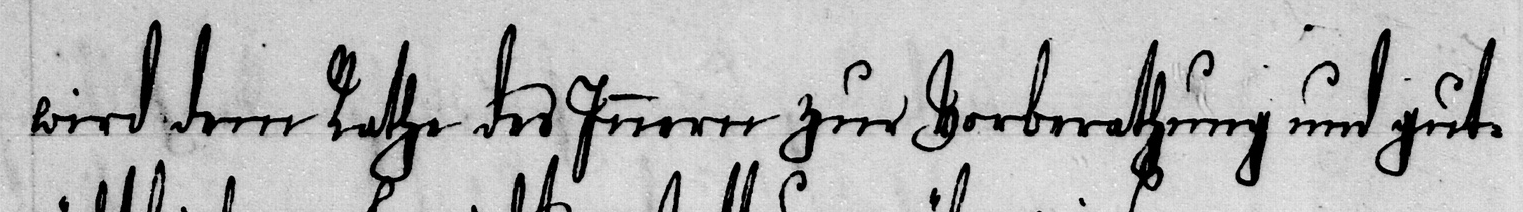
wird dem Rathe des Innern zur Vorberathung und gut¬
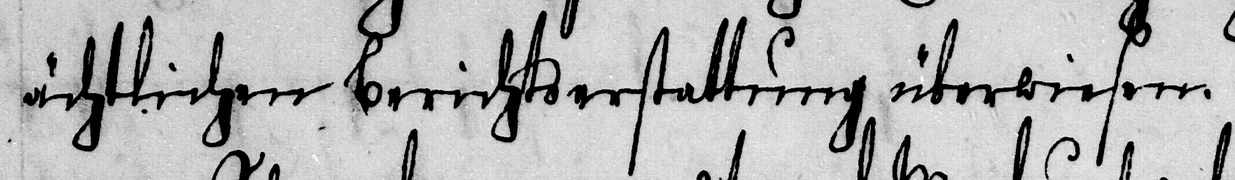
ächtlichen Berichtserstattung überwiesen.
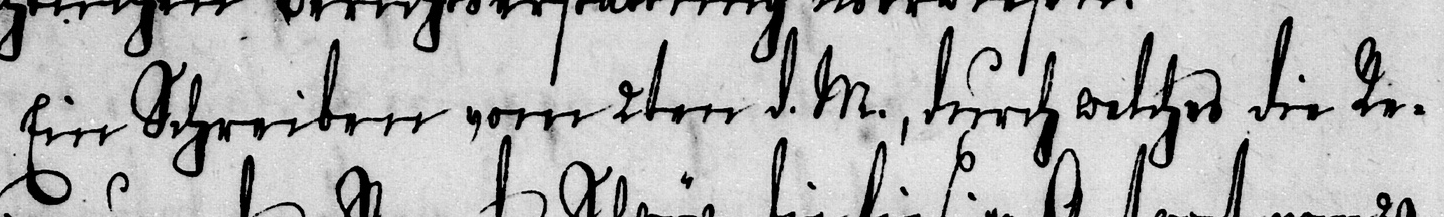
Ein Schreiben vom 2ten d. M., durch welches die Re¬
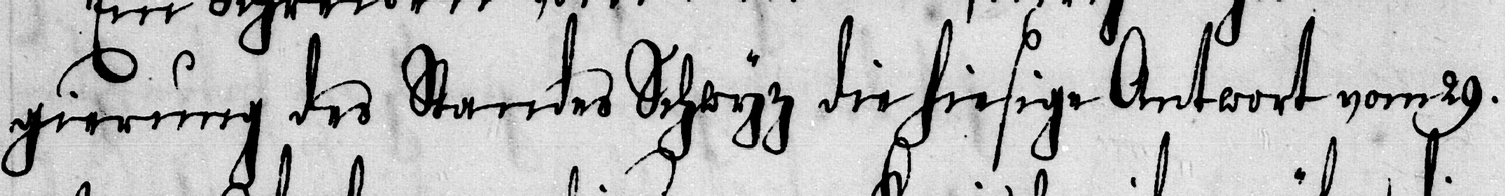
gierung des Standes Schwyz die hiesige Antwort vom 29.
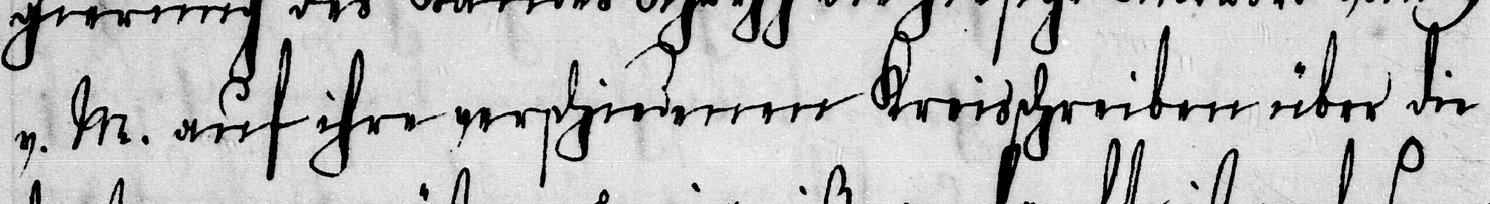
v. M. auf ihre verschiedenen Kreisscheiben über die
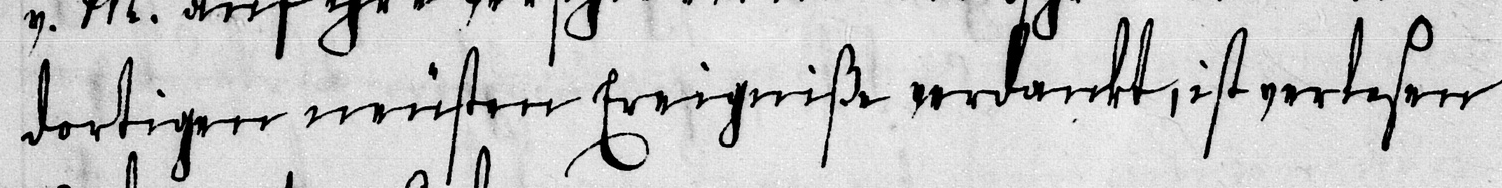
dortigen neusten Ereigniße verdankt, ist verlesen
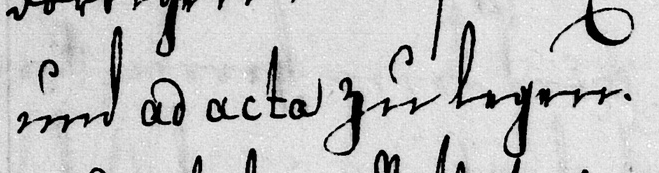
und ad acta zu legen.
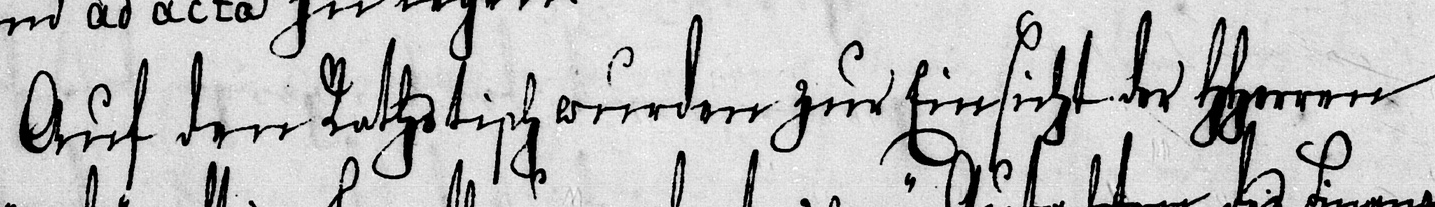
Auf den Rathstisch wurden zur Einsicht der HHerren
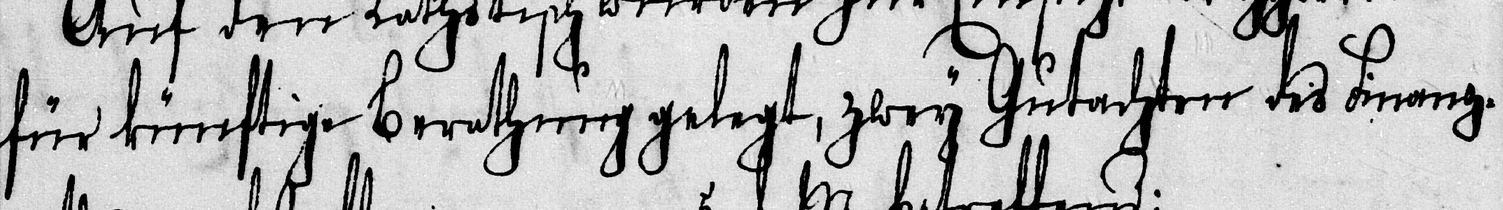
für künftige Berathung gelegt, zwey Gutachten des Finanz¬
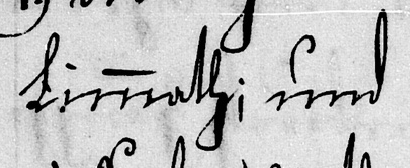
Limmath; und
